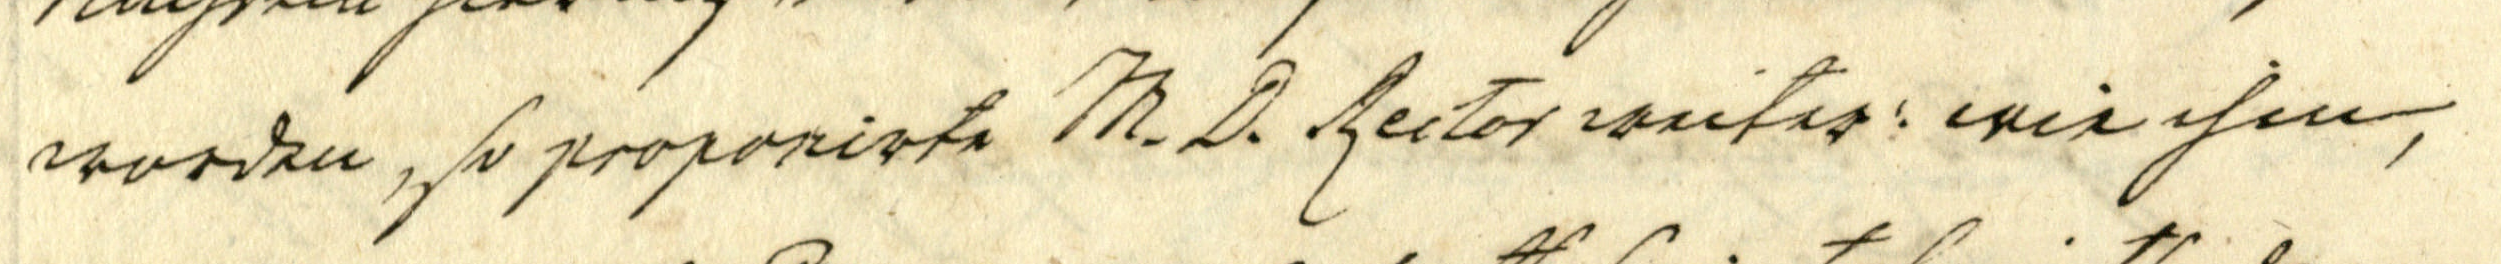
worden, so proponirte M. D. Rector weiter: wie ihm,
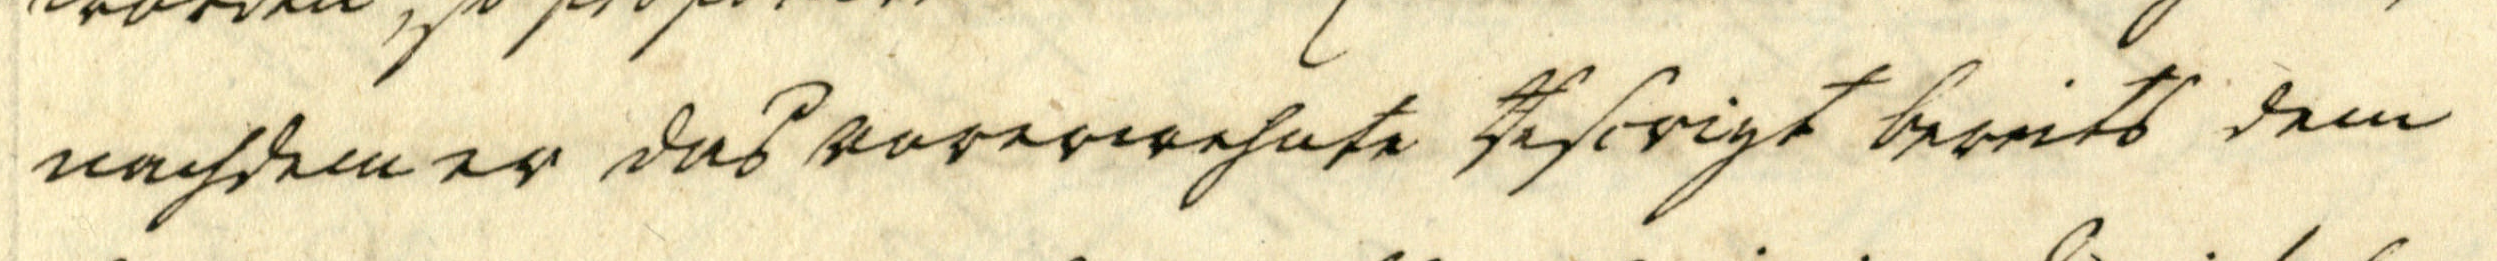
nachdem er das vorerwehnte Rescript bereits dem
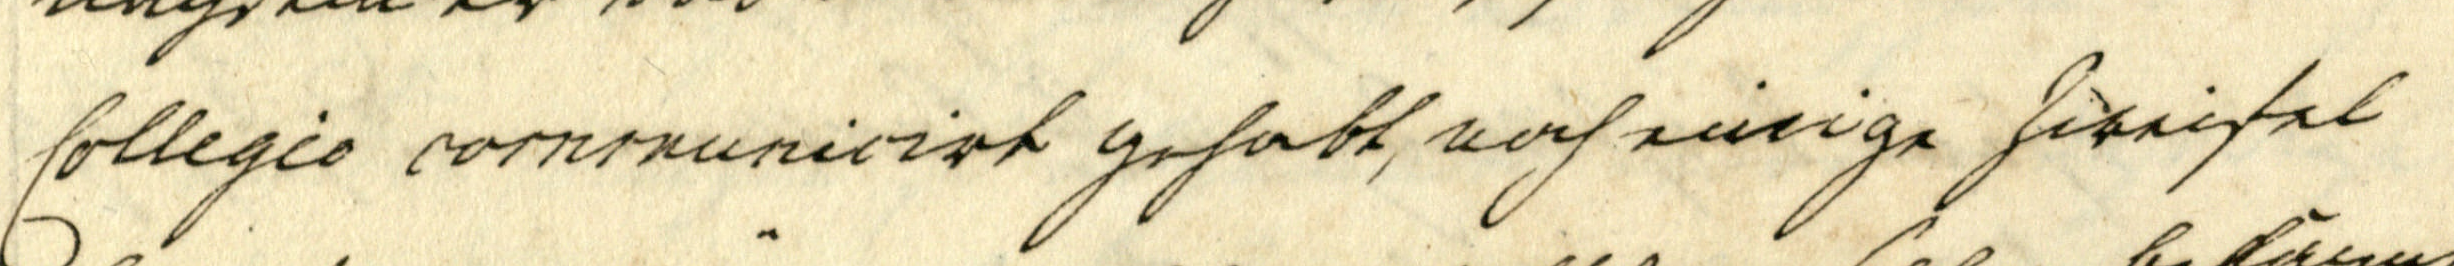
Collegio communicirt gehabt, noch einige Zweifel
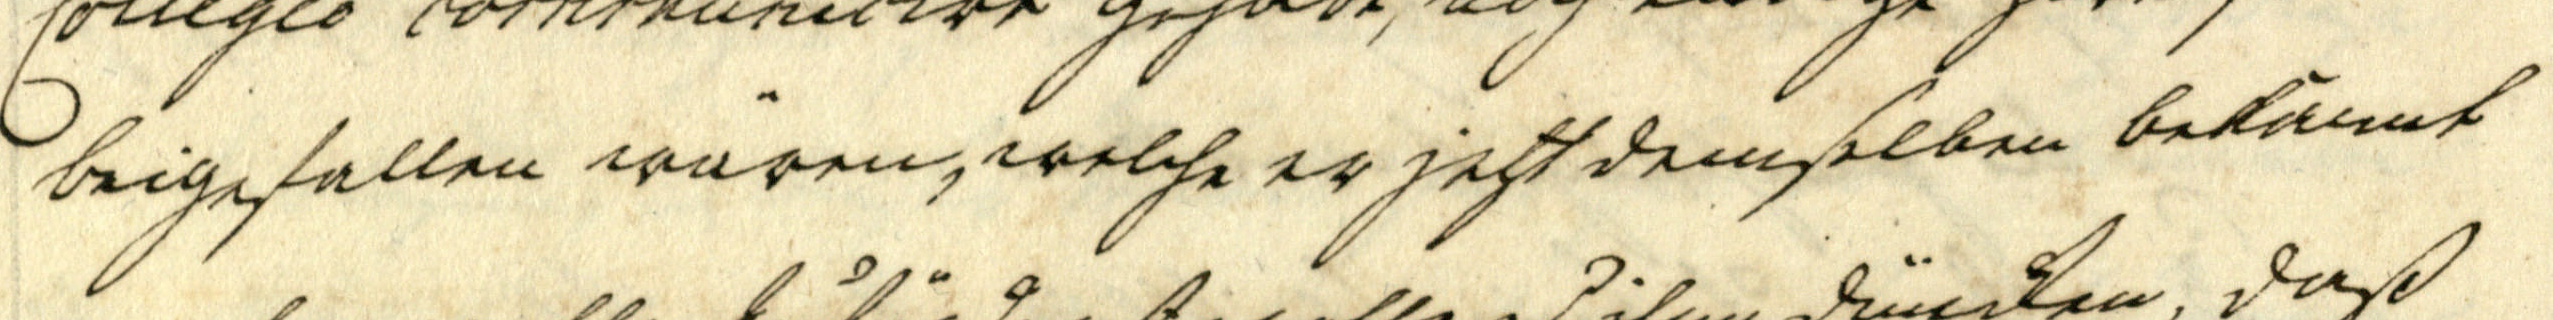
eigefallen wären, welche er jetzt demselben bekannt
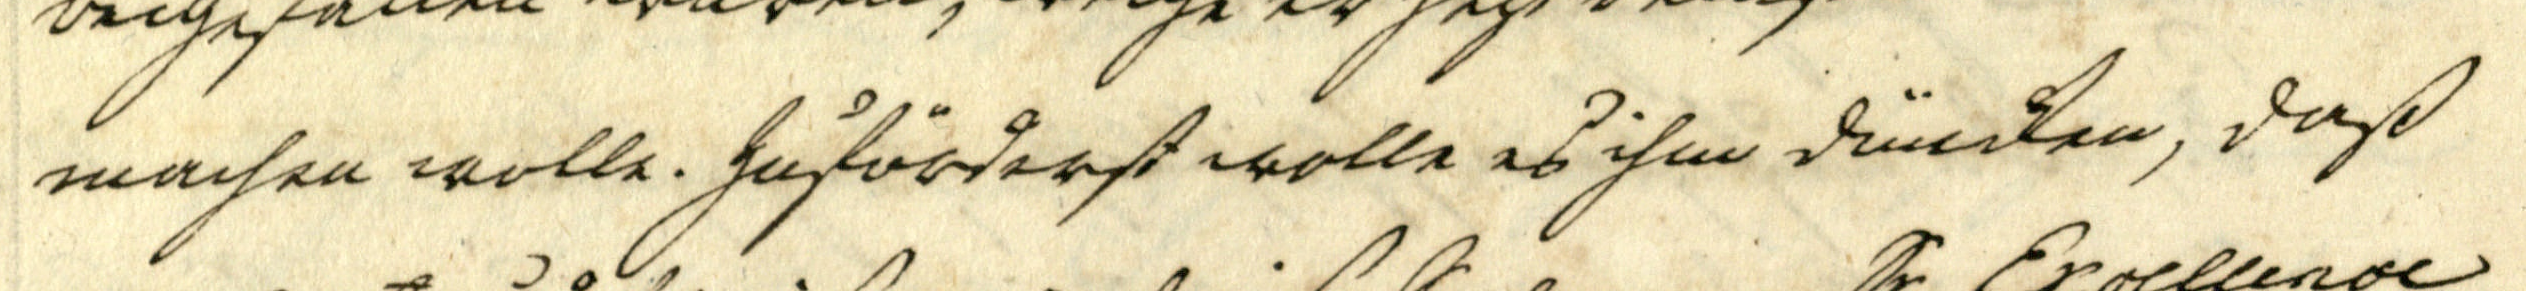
machen wolle. Zuförderst wolle es ihm düncken, daß
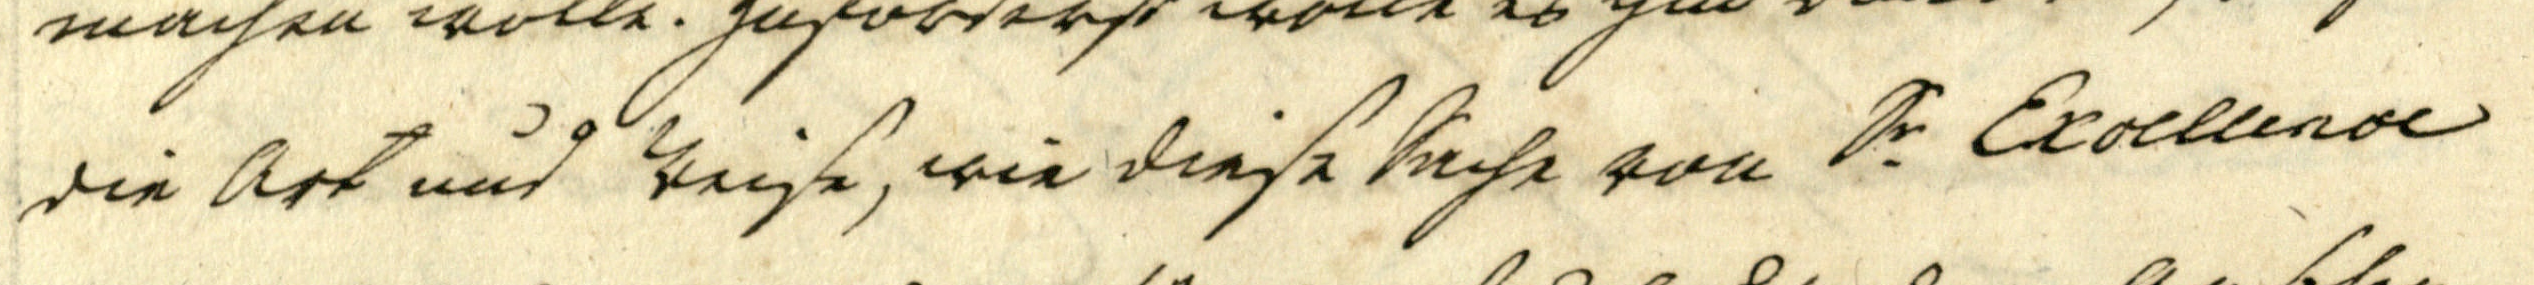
die Art und Weise, wie diese Sache von Sr Excellence
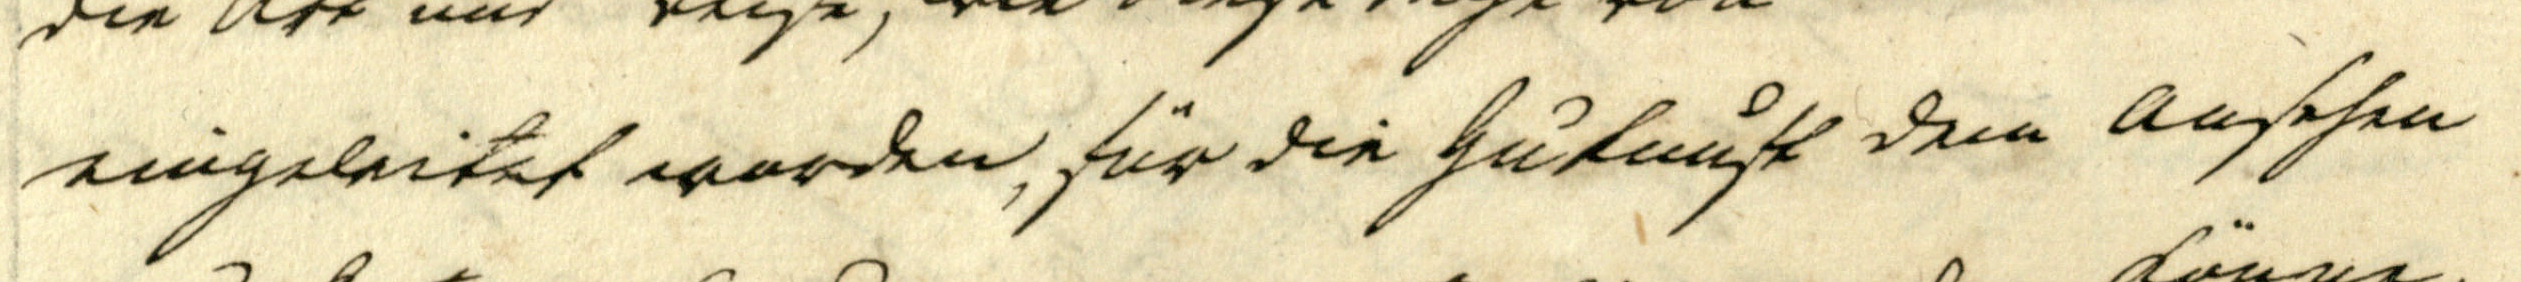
eingeleitet worden, für die Zukunft dem Ansehen
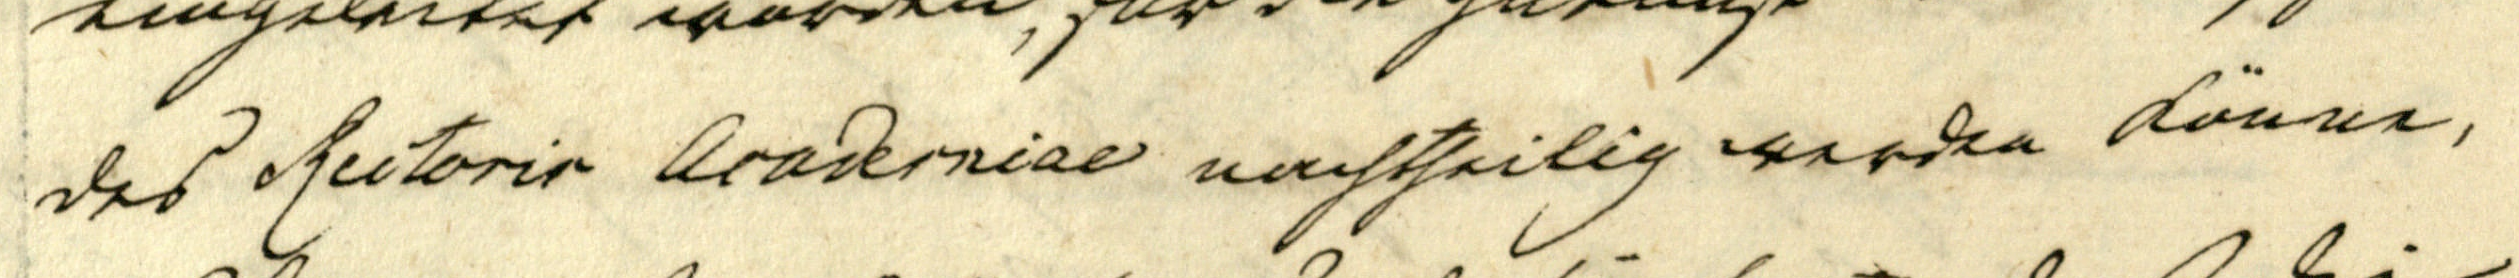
des Rectoris Academiae nachtheilig werden könne,
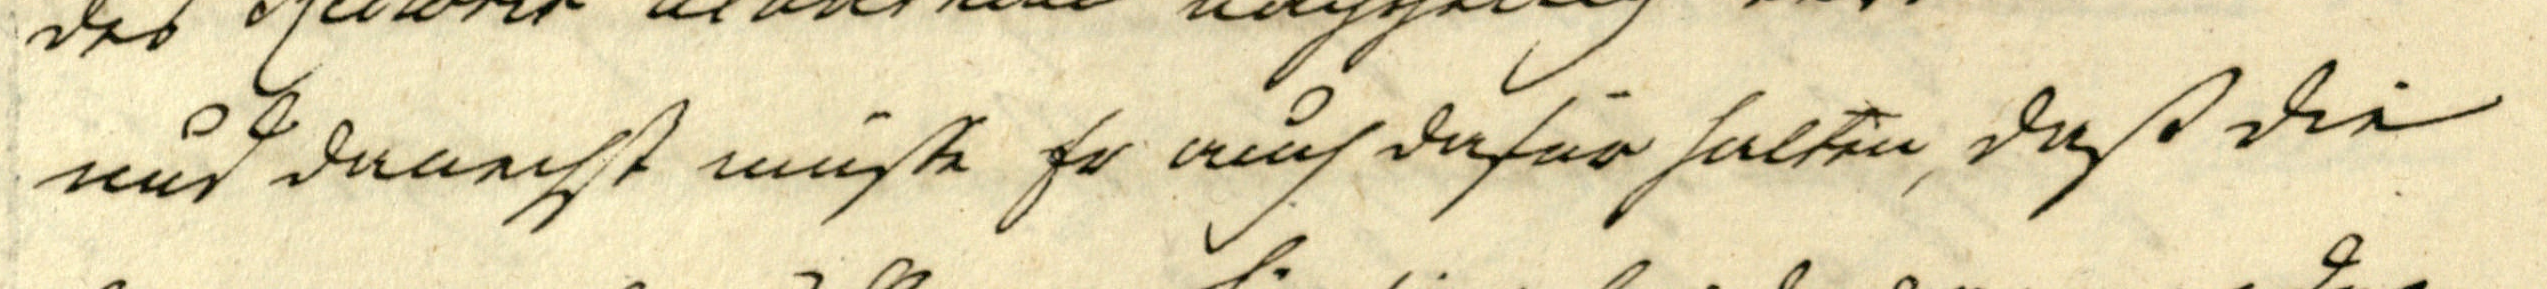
und danechst müsse Er auch dafür halten, daß die
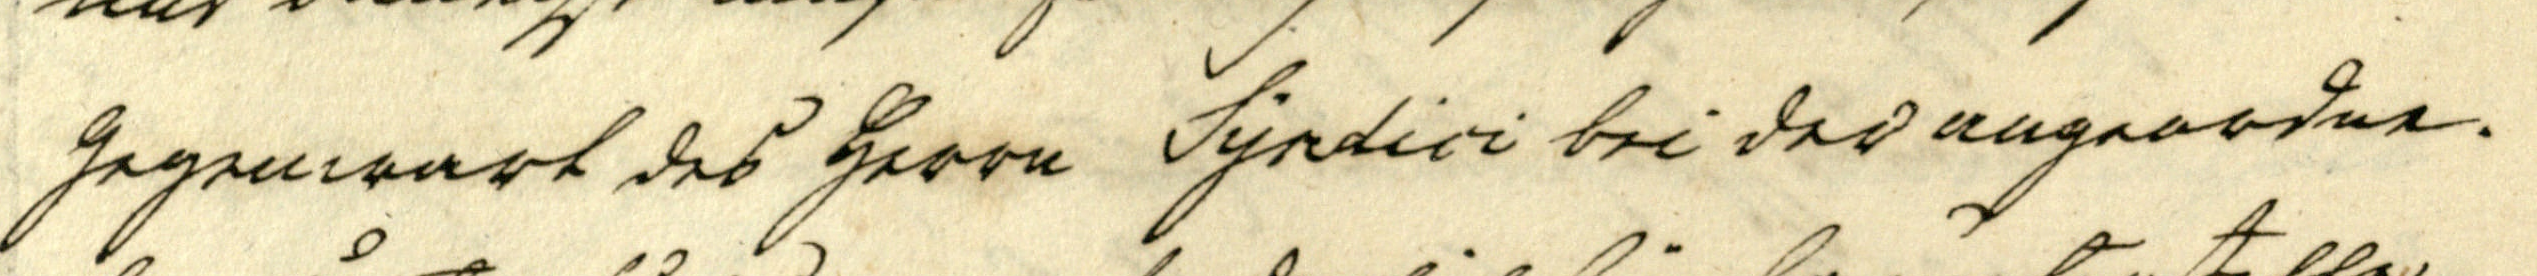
Gegenwart des Herrn Sÿndici bei der angeordne¬
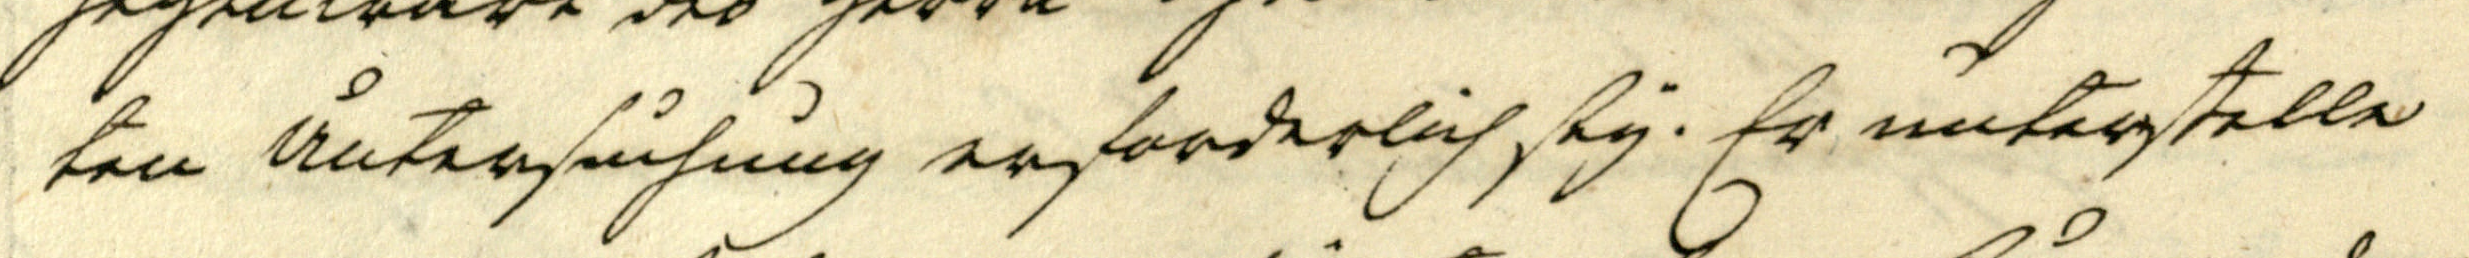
ten Untersuchung erforderlich seÿ. Er unterstelle
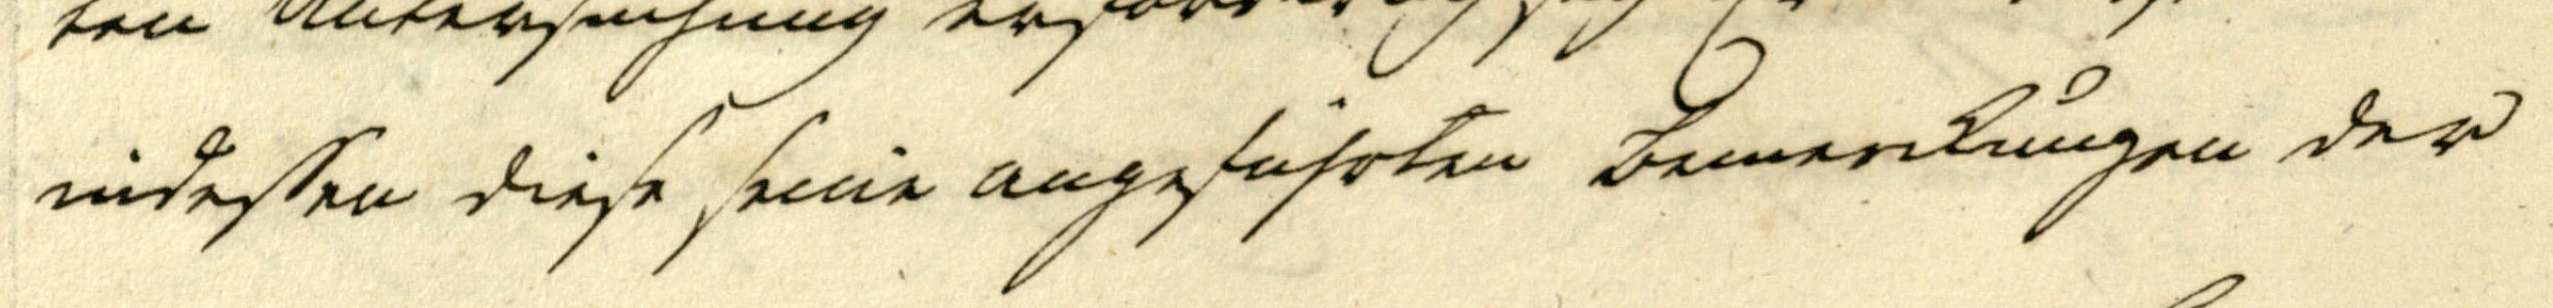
indessen diese seine angeführten Bemerckungen der
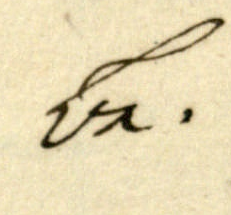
Be.
